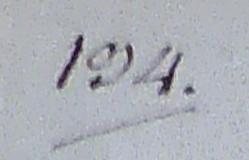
134.
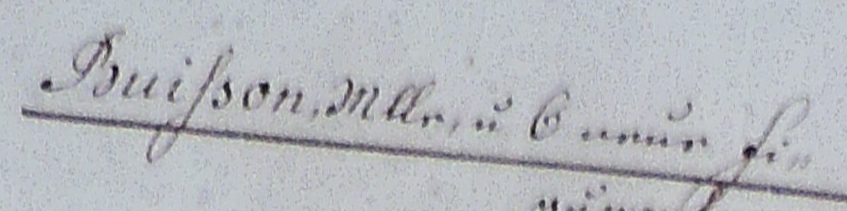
Buisson, Mlle, u 6 neue Fi¬
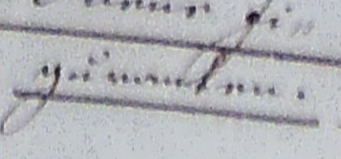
guranten.
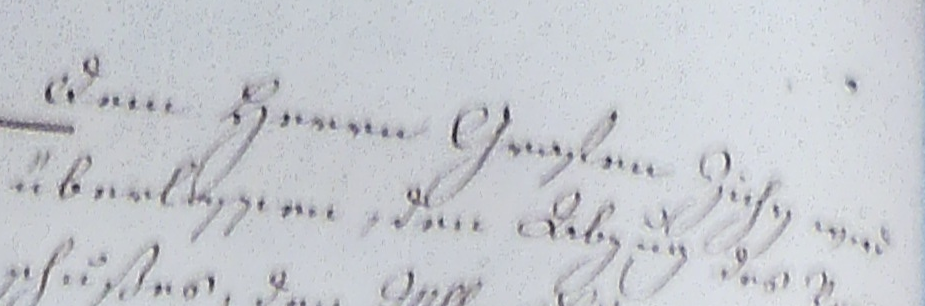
Dem Herrn Grafen Zichy wird
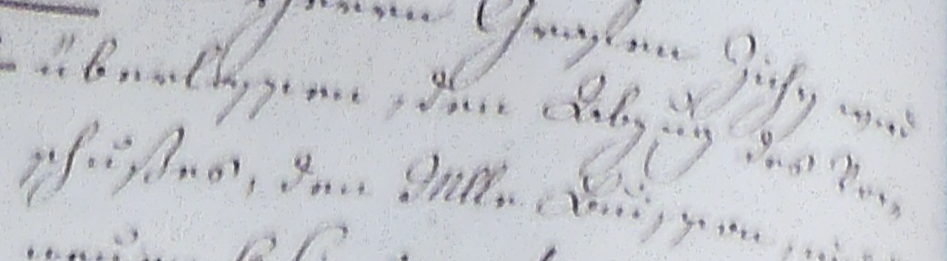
überlassen, den Abzug des Vor¬
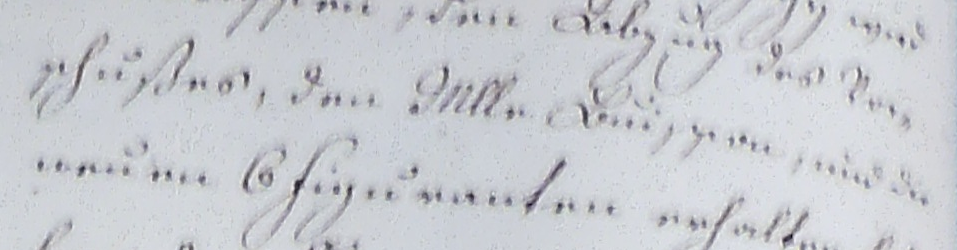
schußes, der Mlle. Buisson, und der
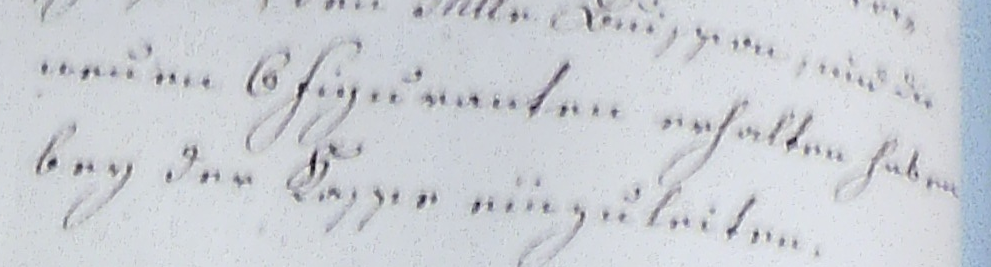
neuen 6 Figuranten erhalten haben
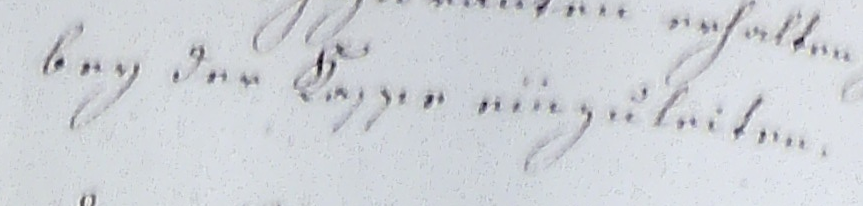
bey der Kasse einzuleiten.
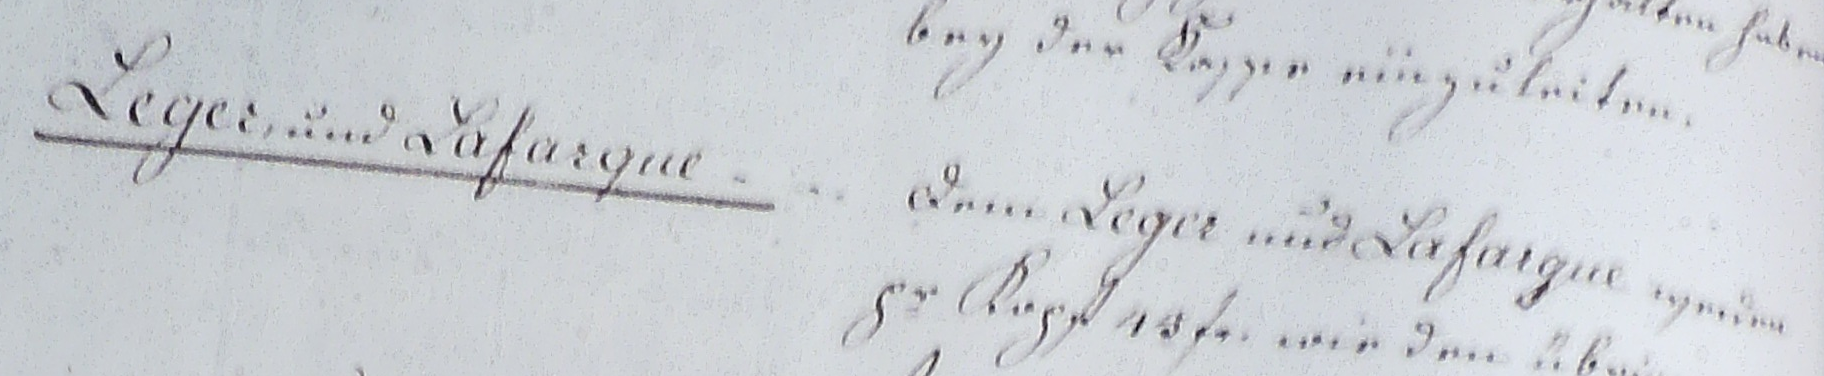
Leger, und Lafarque .. .. Dem Leger und Lafarque werden
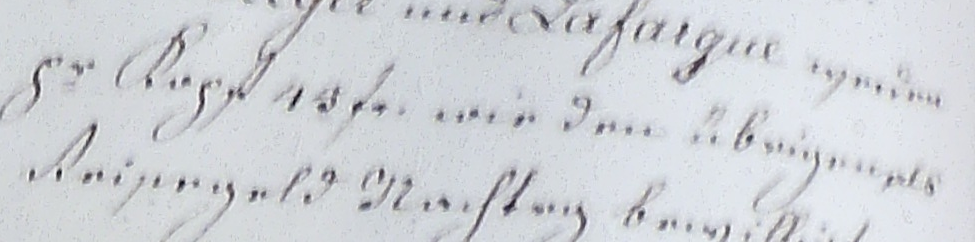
pr͇ Kopf 45 fr. wie den übrigen als
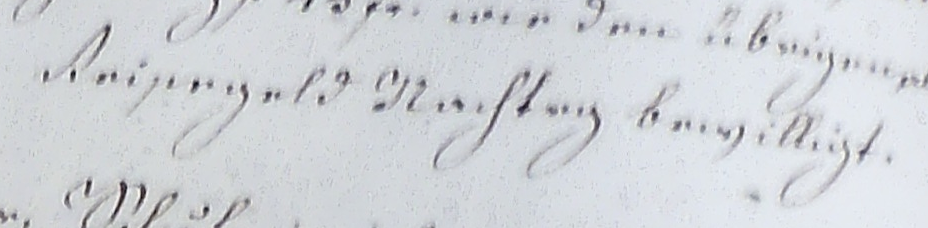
Reisegeld Nachtrag bewilligt.
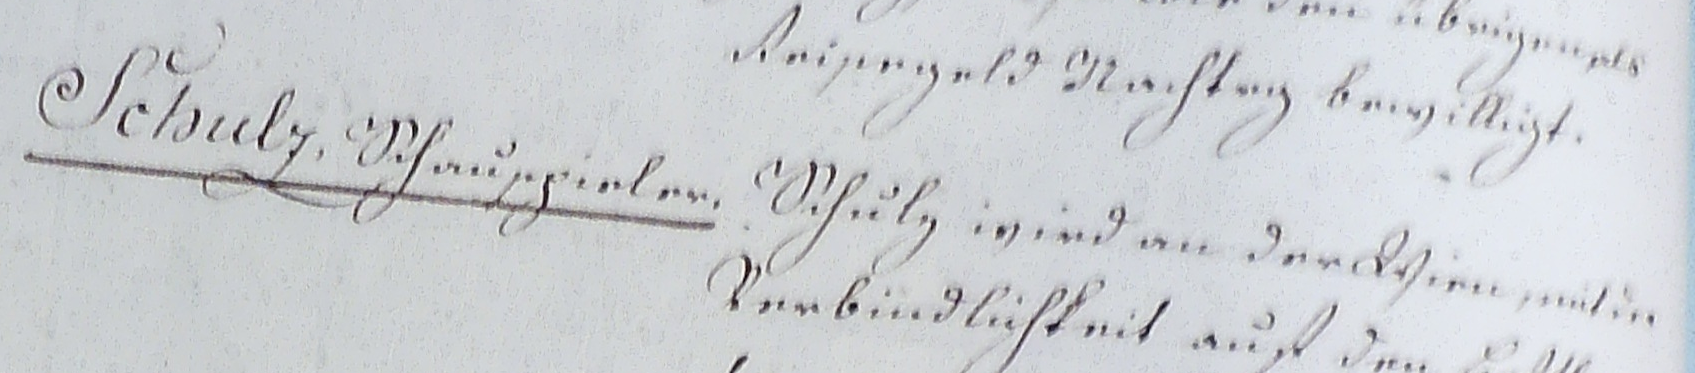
Schulz, Schauspieler. Schulz wird an der Wien, mit in
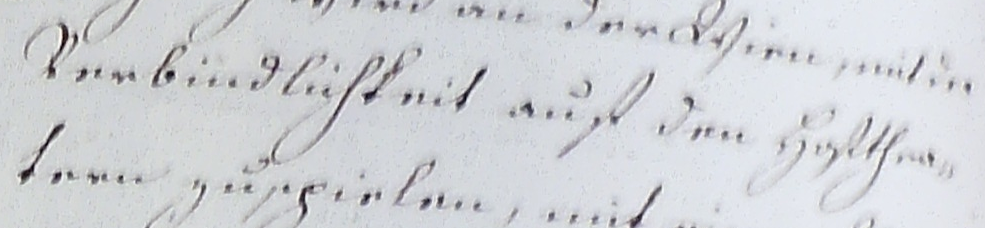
Verbindlichkeit auf den Hofthea¬
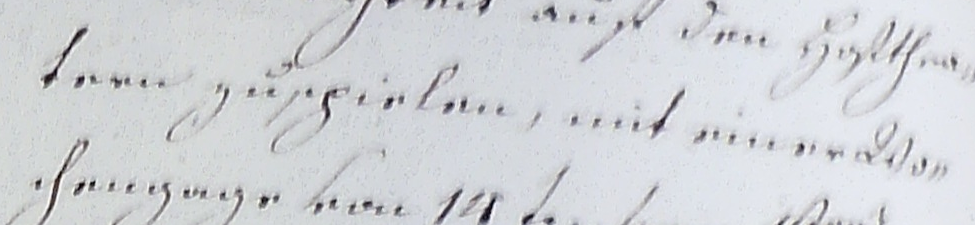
tern zuspielen, mit einer Wo¬
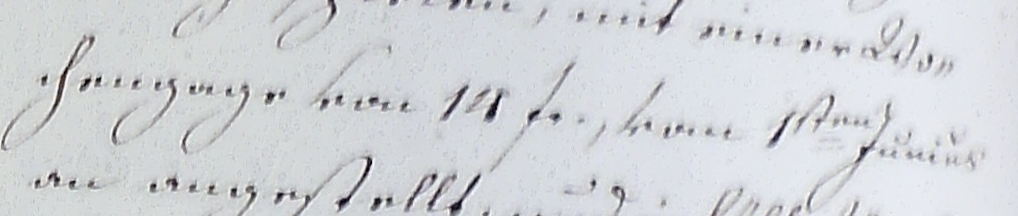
chengage von 14 fr., vom 1ste͇n Junius
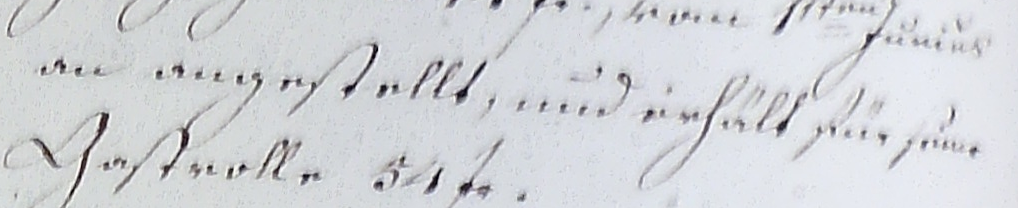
an angestellt, und erhält fir seine
